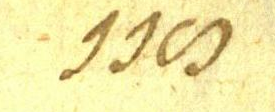118
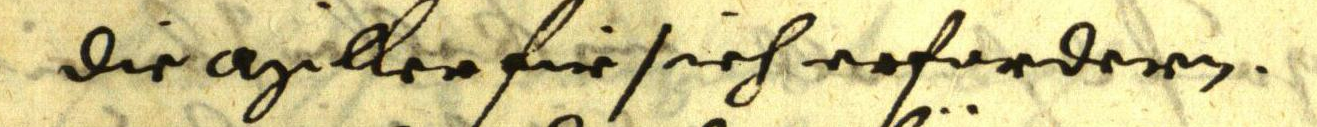die Miller fir sich erfordern.
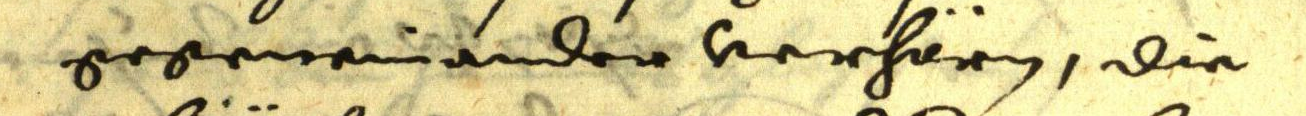gegeneinander verhörn, die
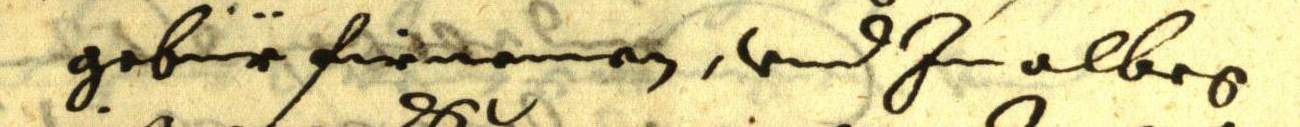gebür firnemen, vnd In albeg
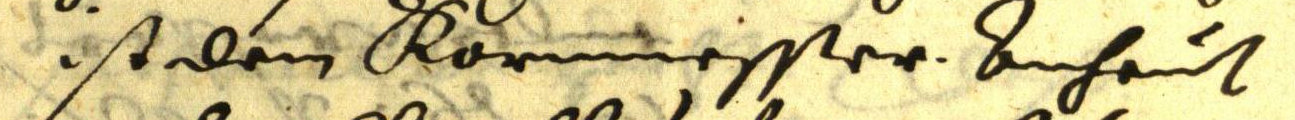ist den Kōrnmesser. Anheūt
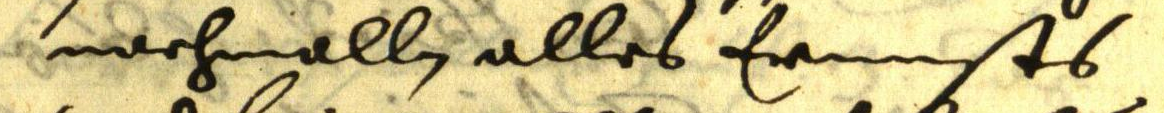nochmalln alles Ernnsts
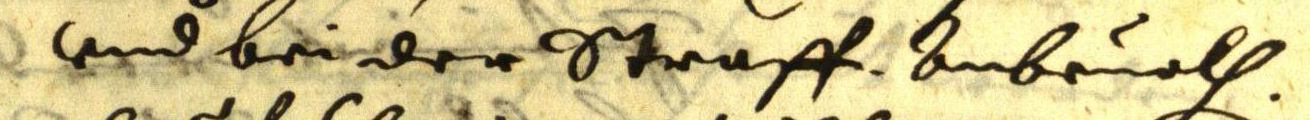vnd bei der Straff Anbeūolh.
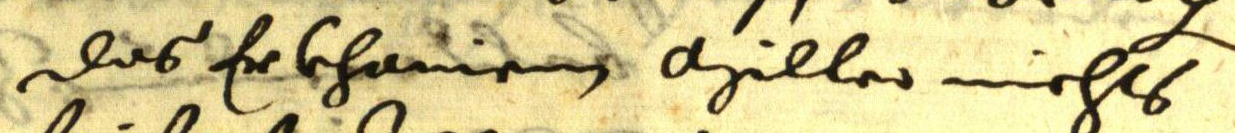das Er khainem Miller nichts
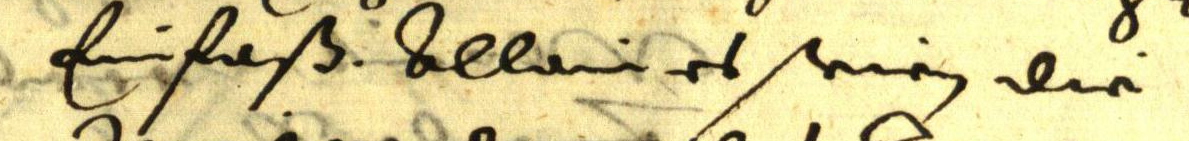Einfaß. Allain es seien die
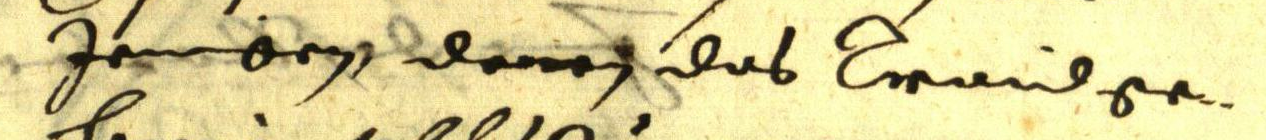Jenigen denen das Traid ge¬
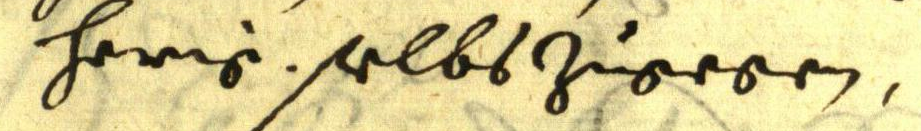herig. selbs Zūgegen,
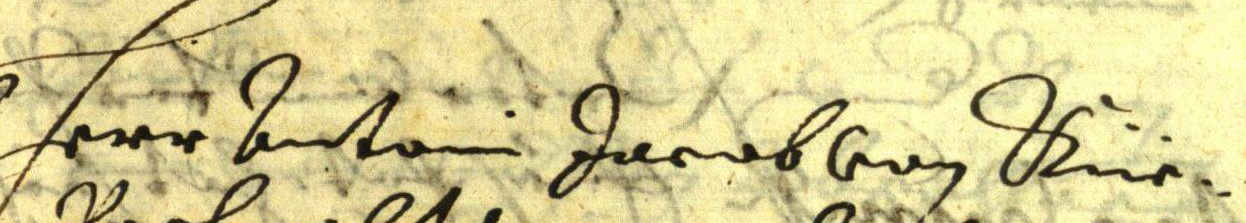Herrn Antoni Jacob von Küe¬
